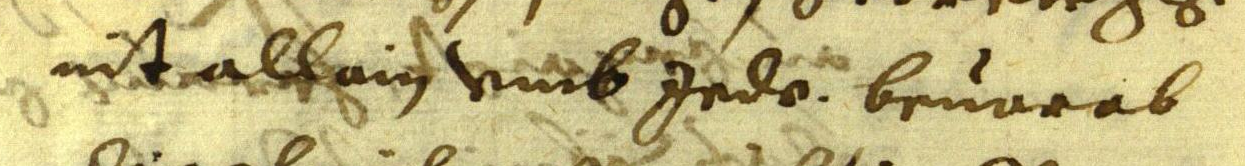nit allain vmb Jede. beūorab
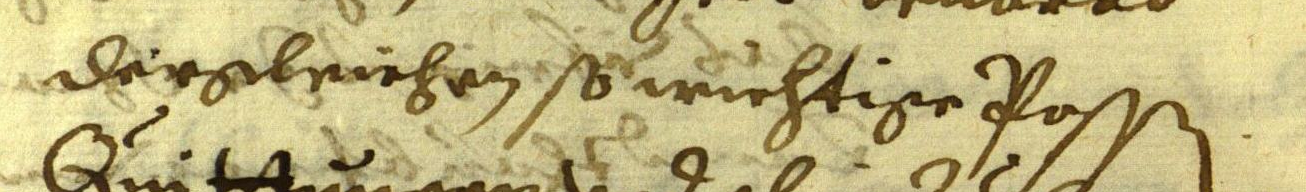dergleichen so wichtiger Posst
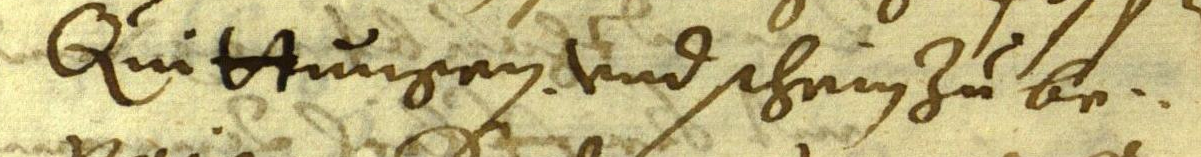Qūittūngen. vnd schein Zū be¬
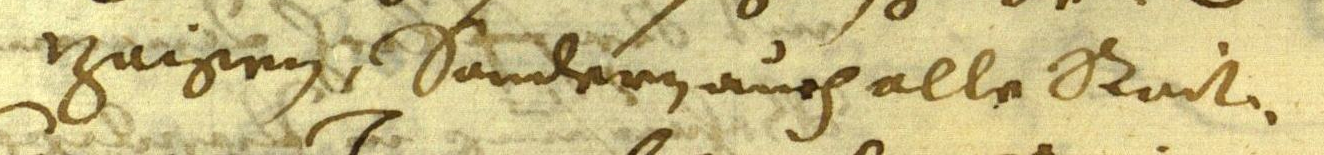zaigen, Sondern aūch alle Rait¬
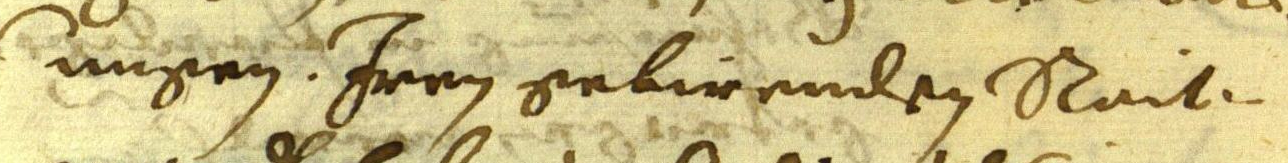ūngen. Iren gebirenden Rait¬
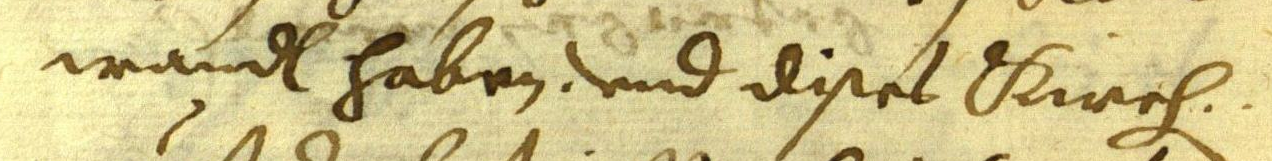wandl haben. vnd dises Kirch¬
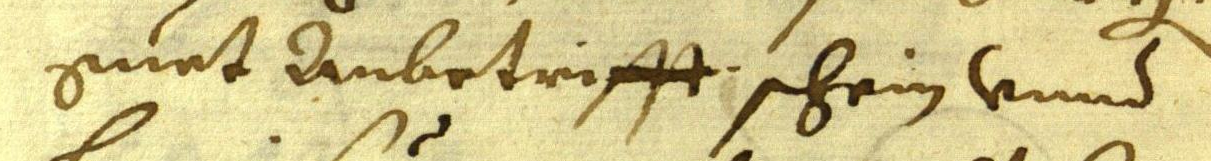gūet Anbetrifft. schein vnnd
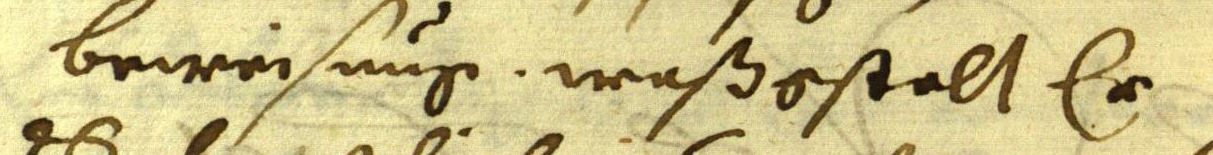beweisūng. waßgstalt Er
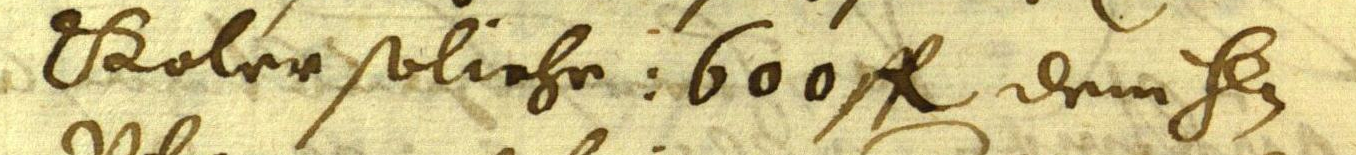Koler soliche: 600 fl dem hln
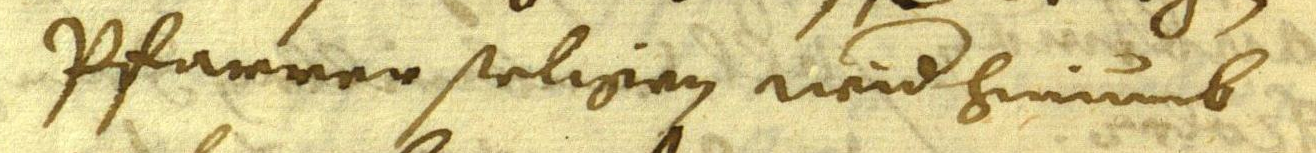Pfarrrer seligen wid hinūmb
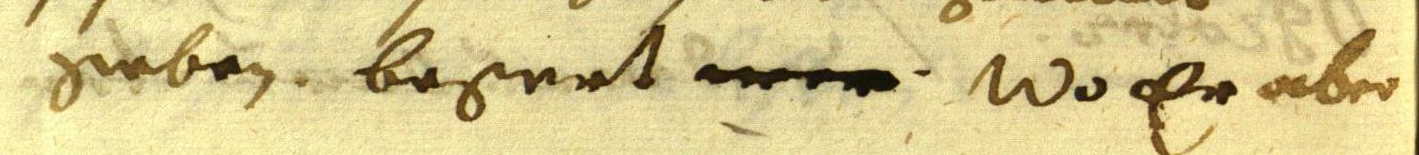geben begert wer. Wo Er aber
